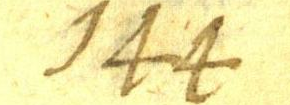144
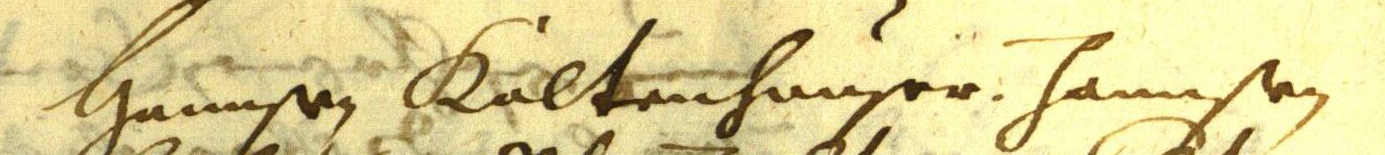Hannsen Kaltenhaūser. Hannsen
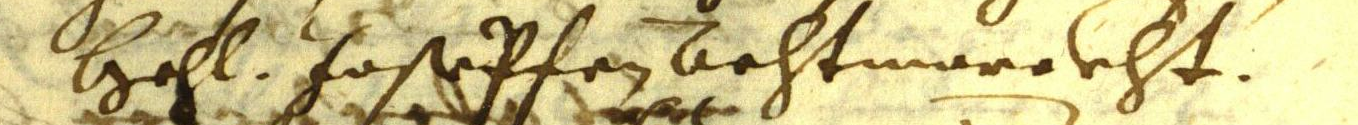Hehl. Joseffen Achtmarckht.
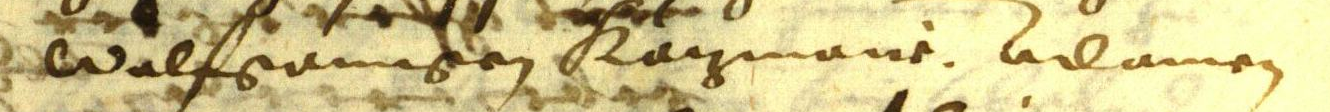Wolfganngen Kazmair. Adamen
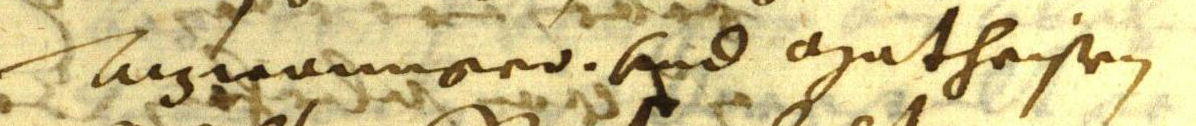Azwannger. vnd Matheisen
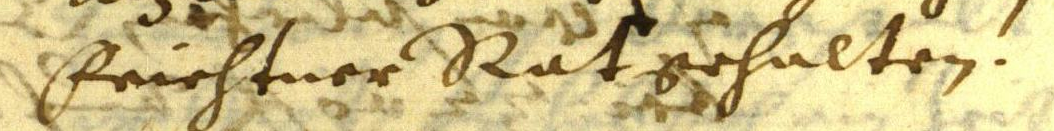Feichtner Rat gehalten.
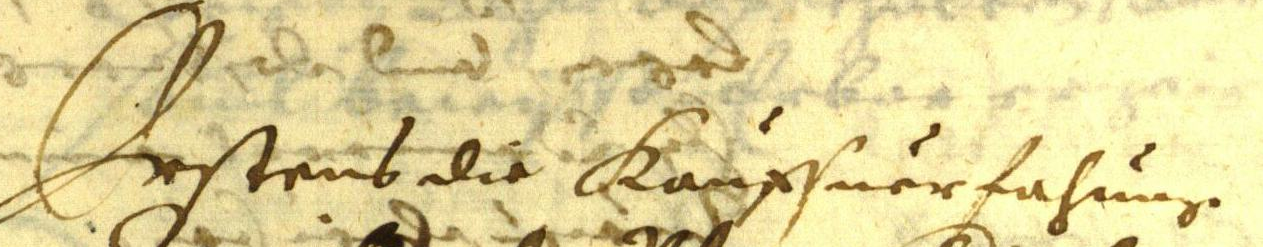Erstens die Kaūfsūerfahūng
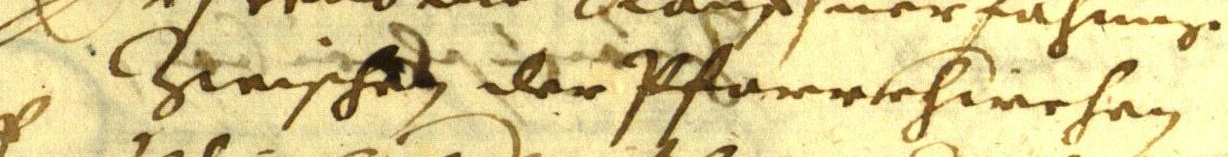Zwischen der Pfarrkhirchen
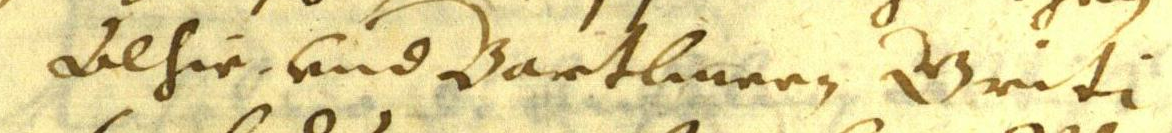Alhie. vnd Bartlmeen Griti
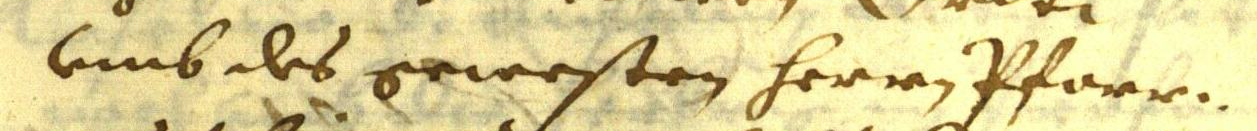vmb des gwesten herrn Pfarr¬
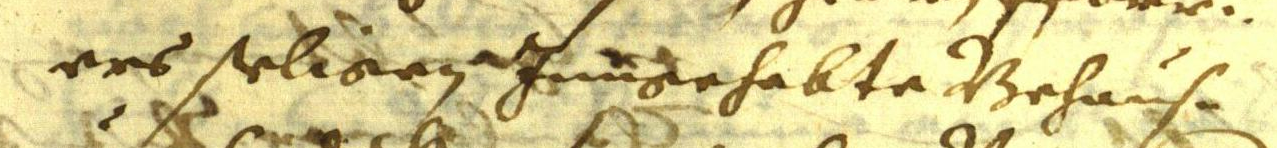ers seligen Inngehabte Behaūs¬
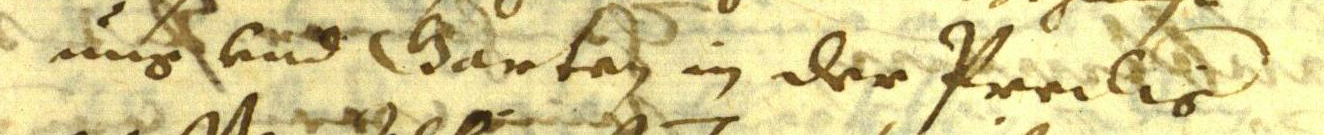ūng vnd Garten in der Predig
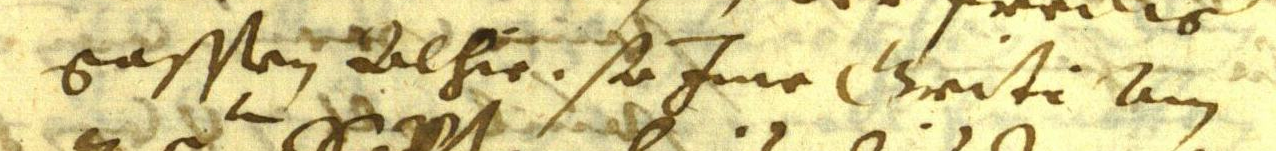gassen Alhie. so Ime Griti Am
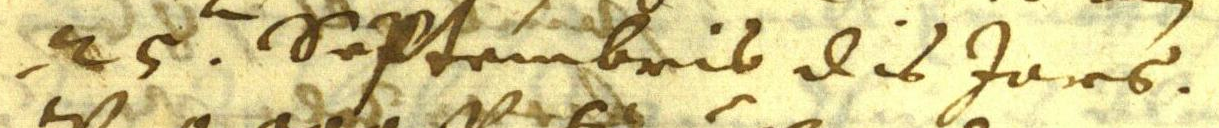.25.t SePtembris dis Jars.
